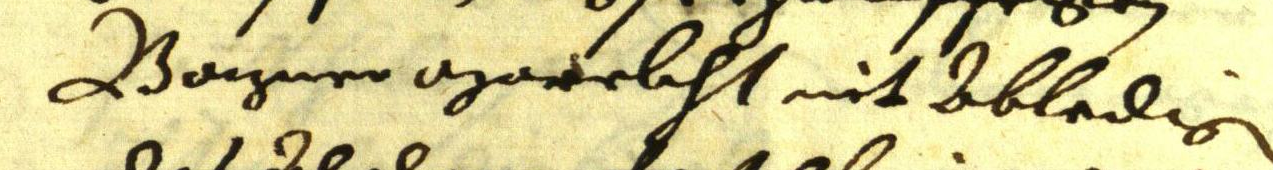Bozner Marckht nit Abledig
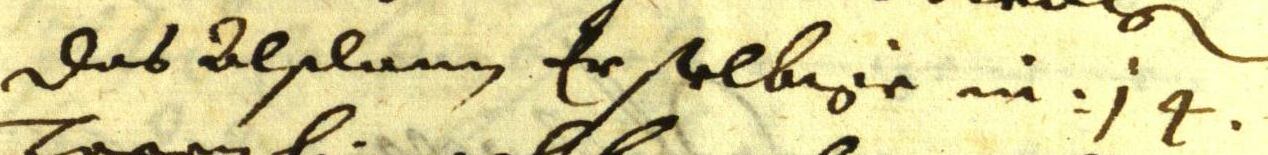Das Alsdann Er selbige in: 14.
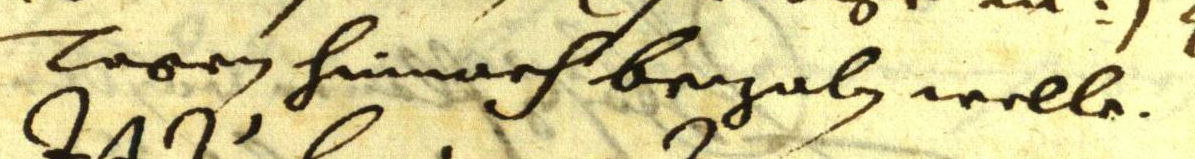Tagen hinnach bezaln welle.
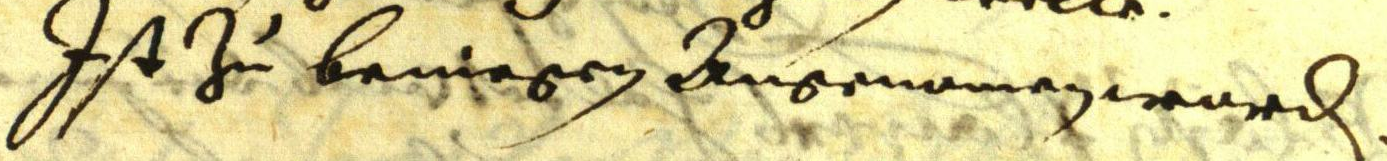Ist Zū beniegen Angenomen word.
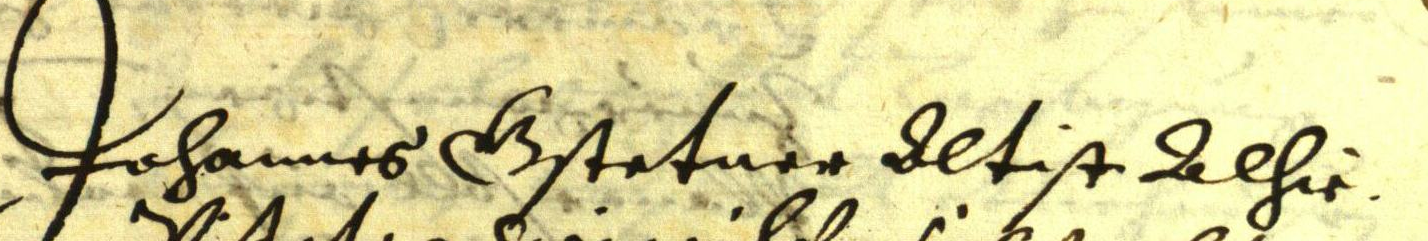Johannes Gstetner Altist Alhie.
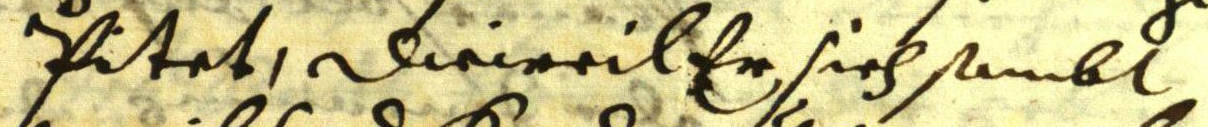Pitet, dieweil Er sich sambt
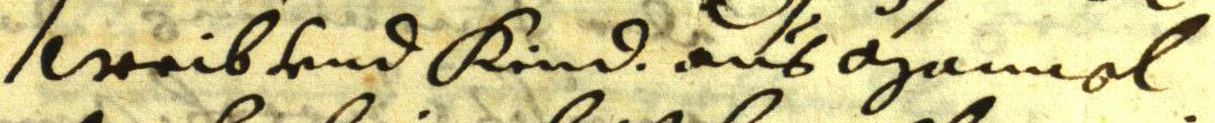Weib vnd Kind. aūs Manngl
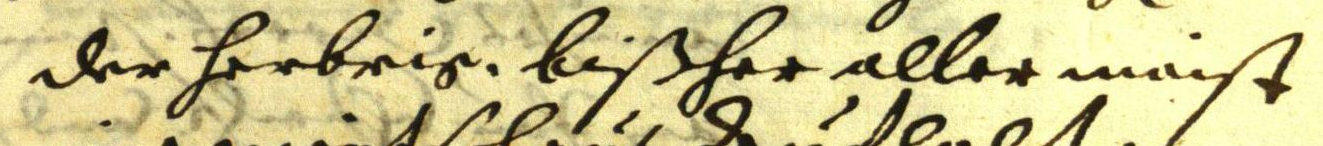der herbrig. bißher aller maist
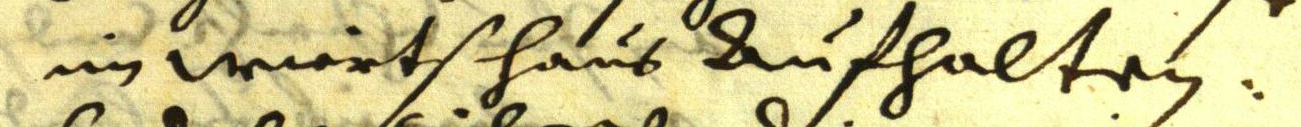im wiertshaūs Aūfhalten:
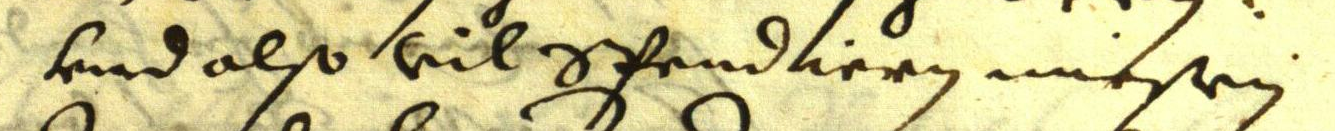vnd also vil SPendiern miesen
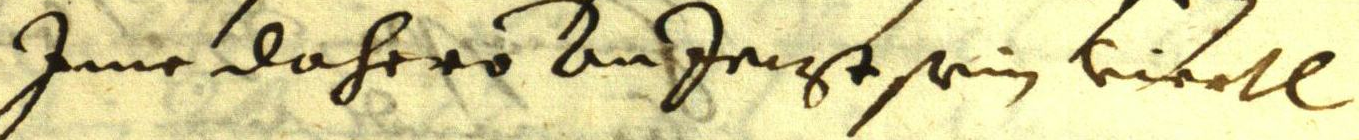Ime dahero An Jezt sein viertl
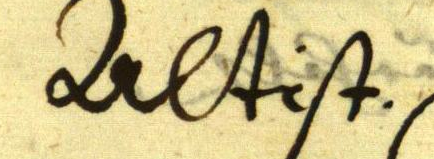Altist.
